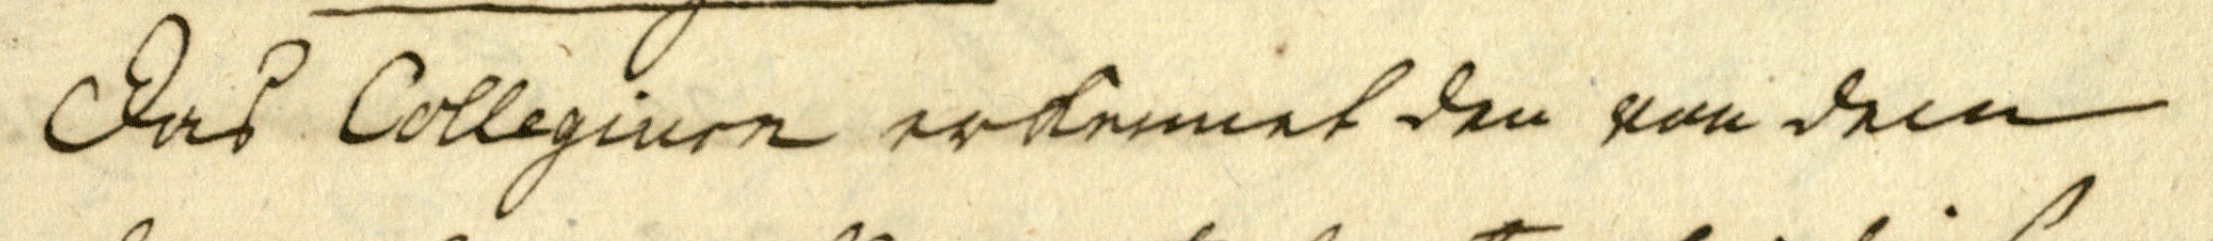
Das Collegium erkennet den von dem
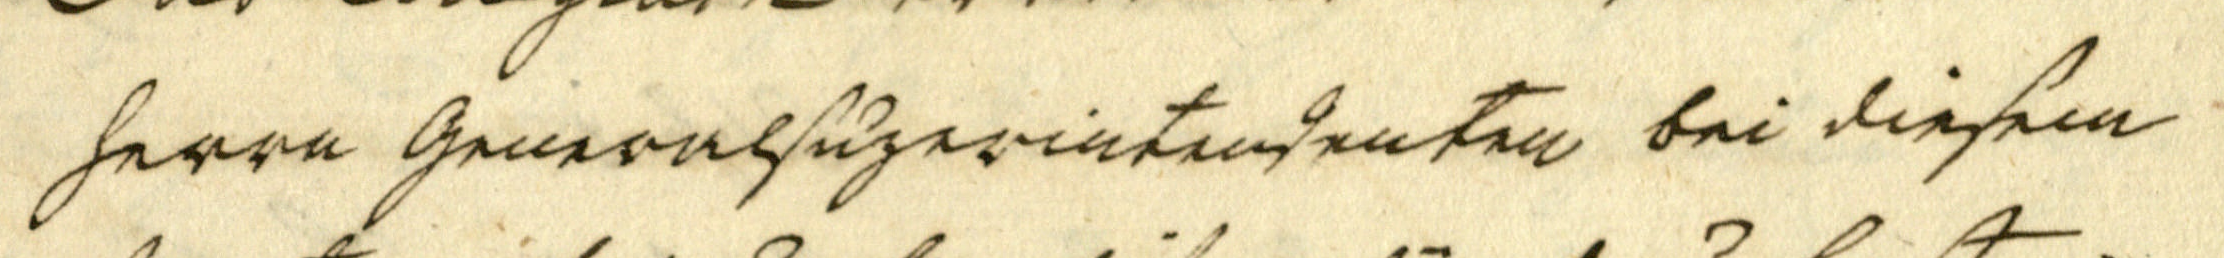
Herrn Generalsuperintendenten bei diesem
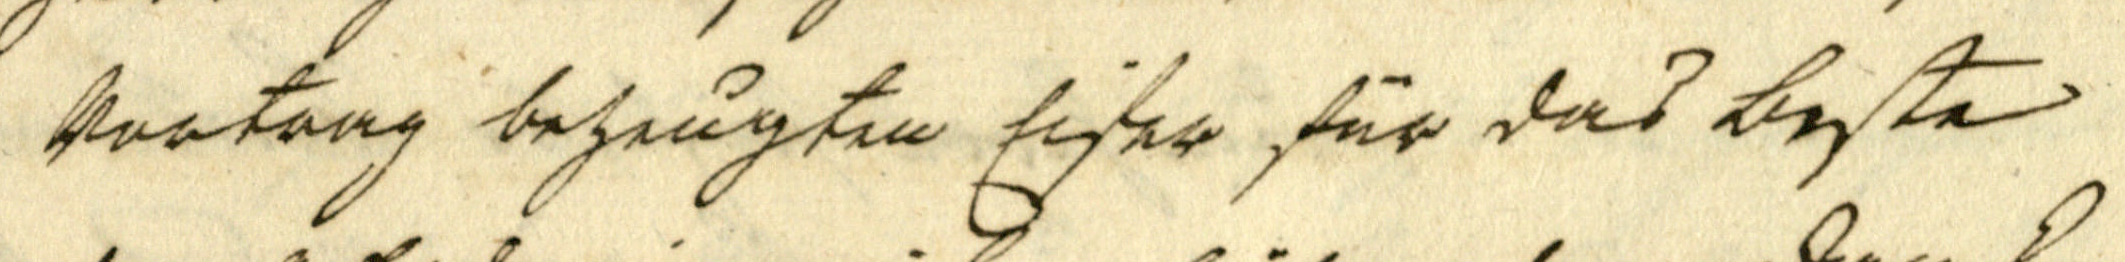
Vortrag bezeugten Eifer für das Beste
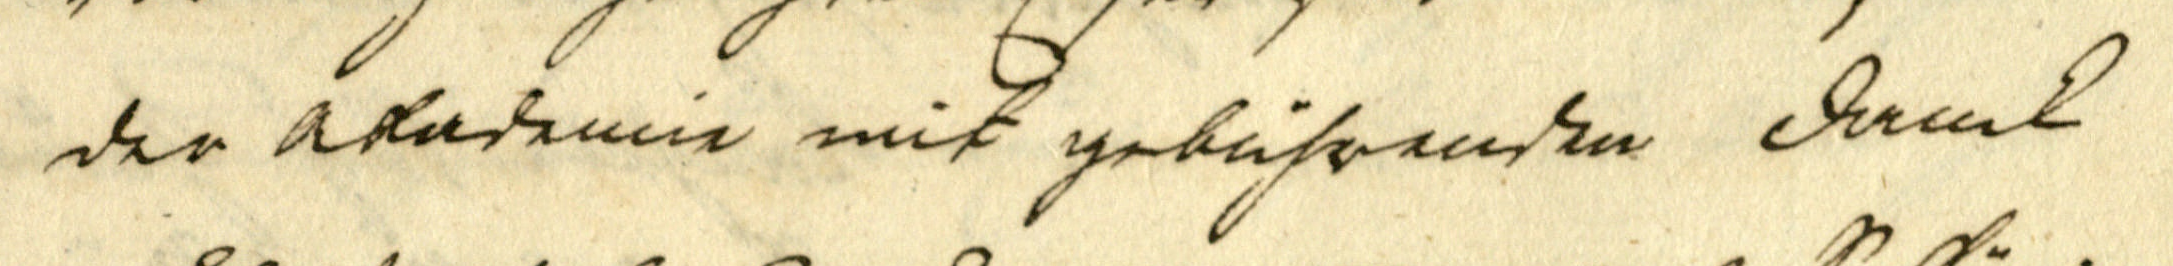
der Akademie mit gebührenden Danck
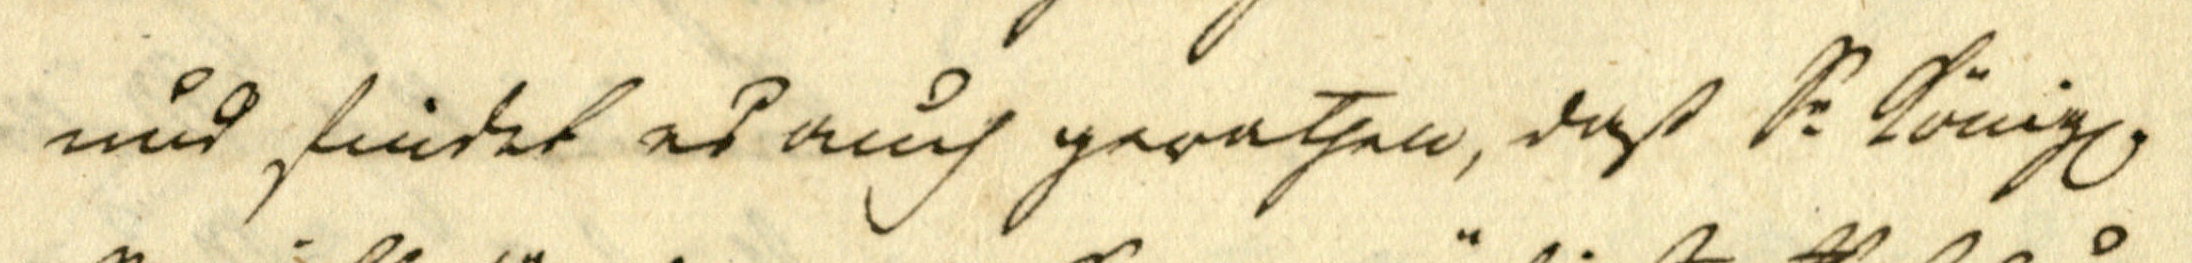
und findet es auch gerathen, daß Sr Königl.
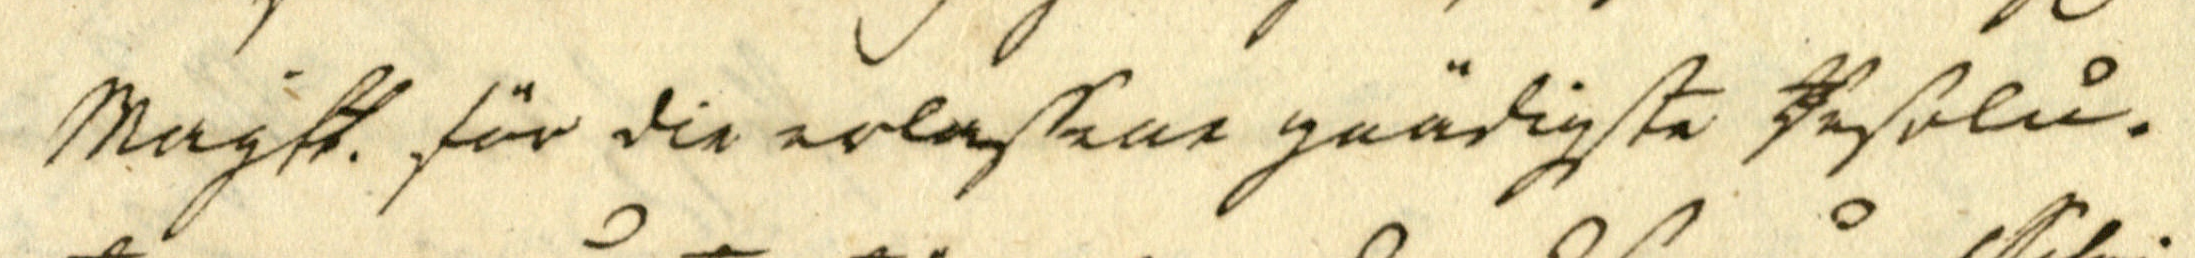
Maÿtt. für die erlassene gnädigste Resolu¬
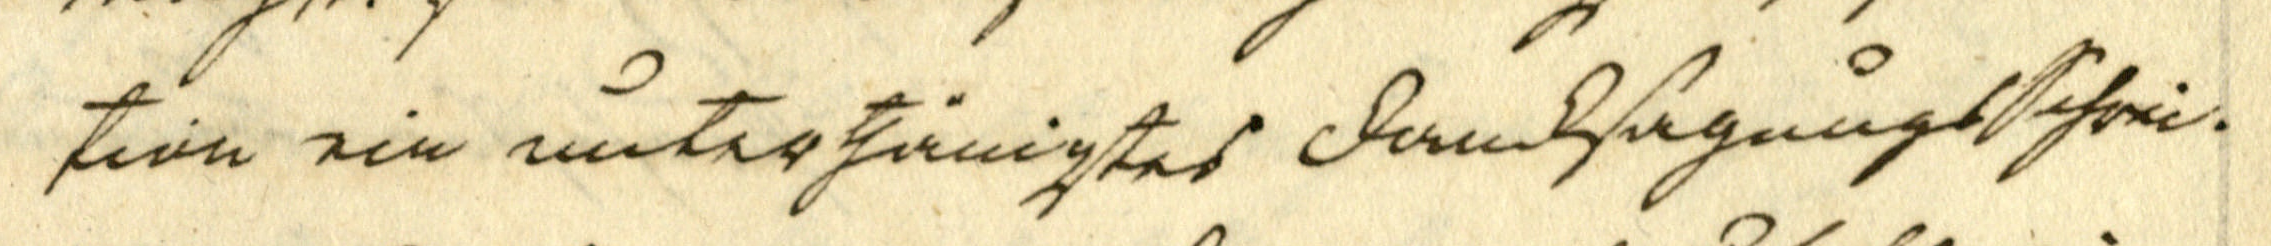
tion ein unterhänigstes DancksagungsSchrei¬
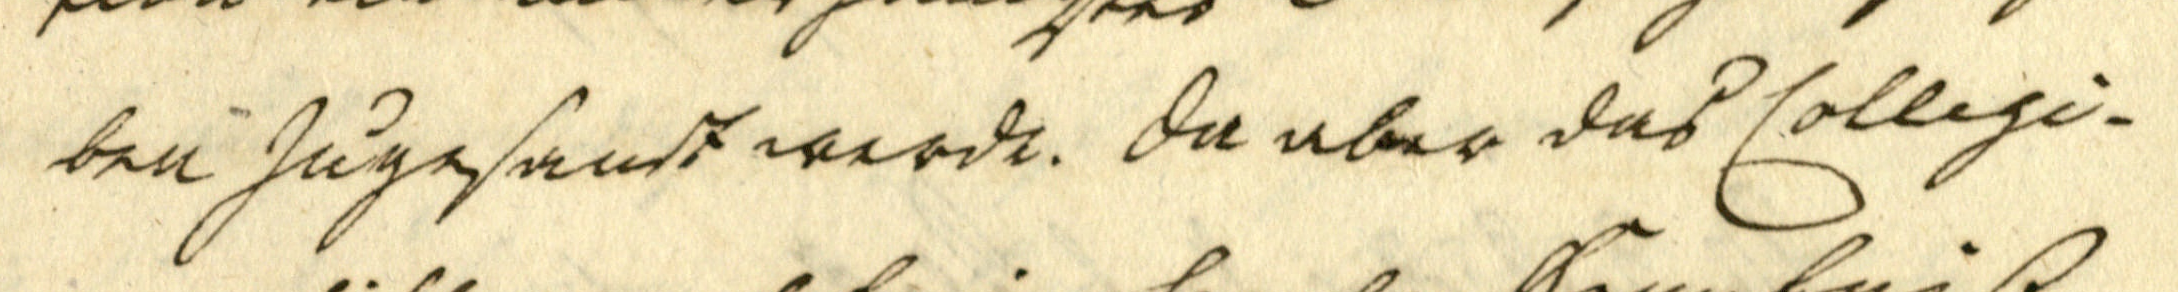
ben zugesandt werde. Da aber das Collegi¬
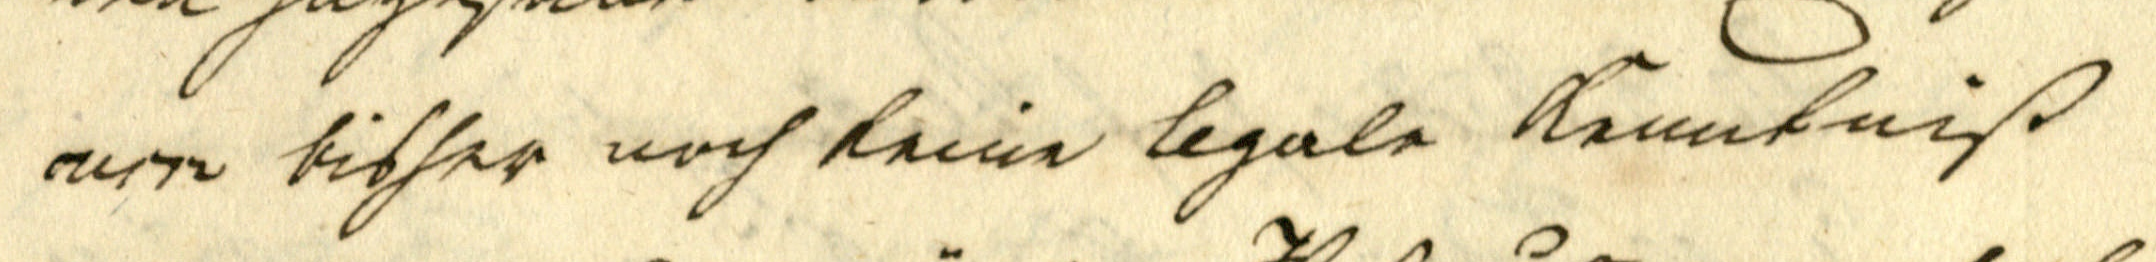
um bisher noch keine legale Kenntniß
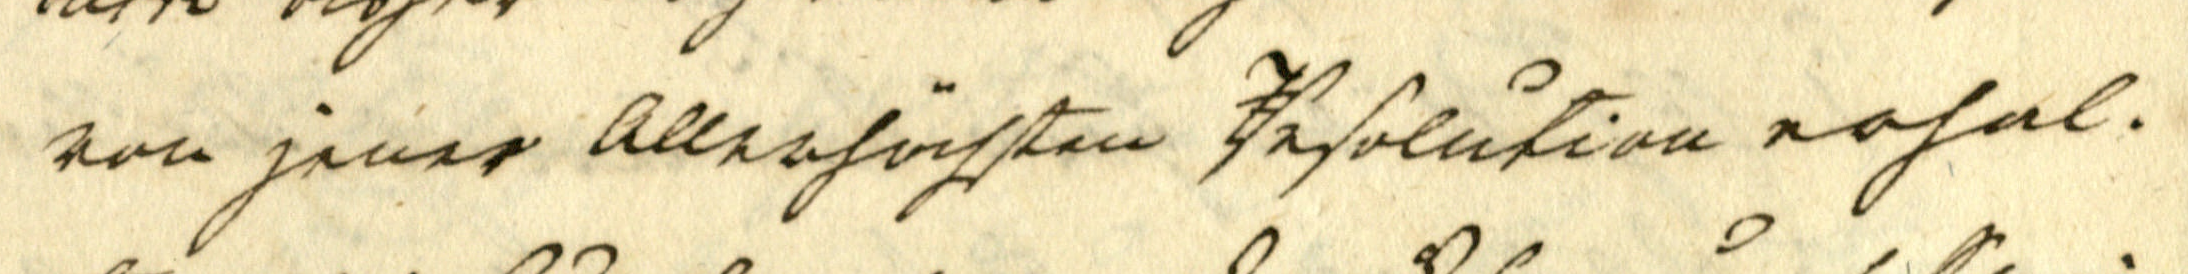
von jener Allerhöchsten Resolution erhal¬
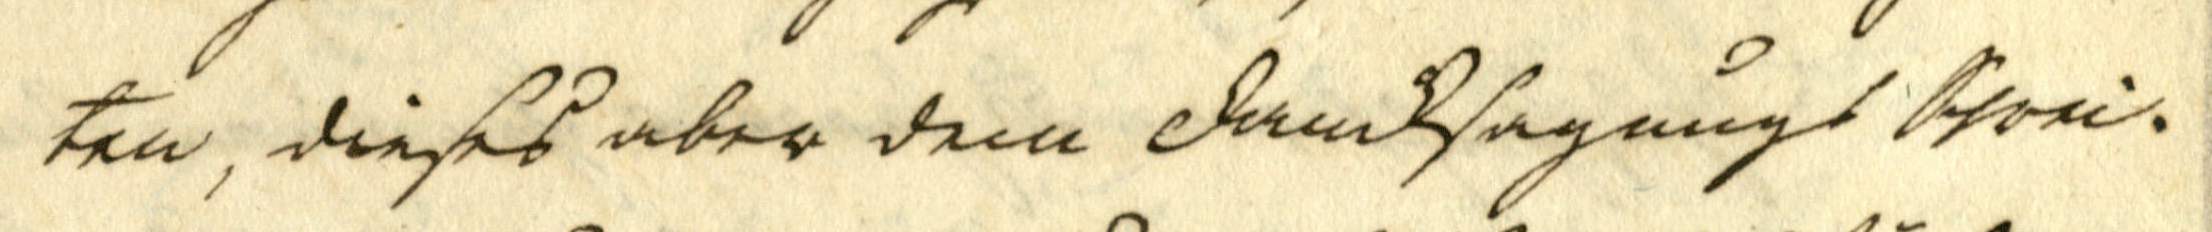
ten, dieses aber dem Dancksagungs Schrei¬
